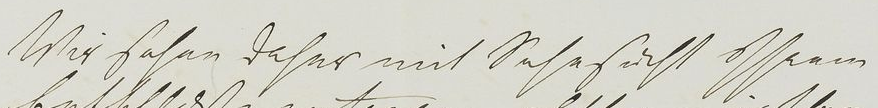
Wir sehen daher mit Sehnsucht Ihrem
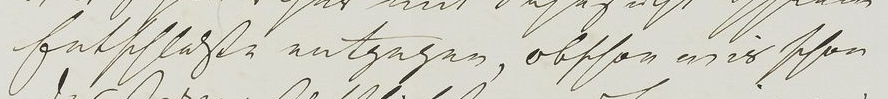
Entschluße entgegen, obschon wir schon
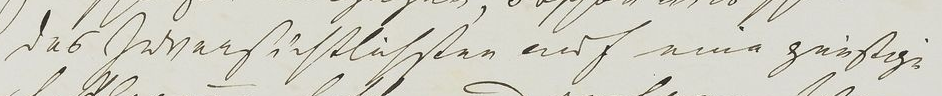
des Zuversichtlichsten auf eine günstige
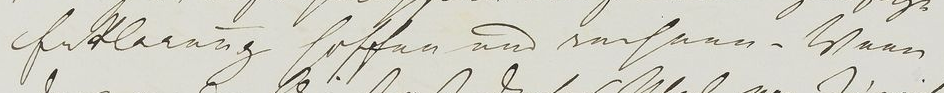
Erklärung hoffen und rechnen. Wenn
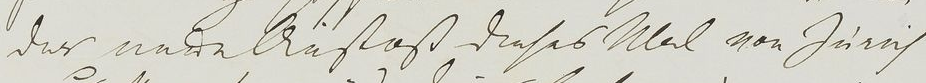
der neue Anstoß dieses Mal von Zürich
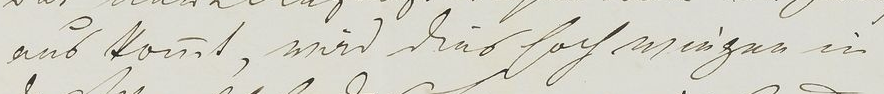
aus kommt, wird dies hoch wiegen in
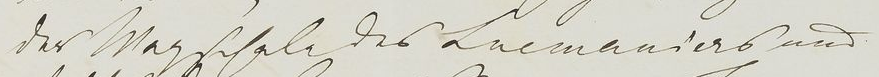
der Wagschale des Lucmaniers und
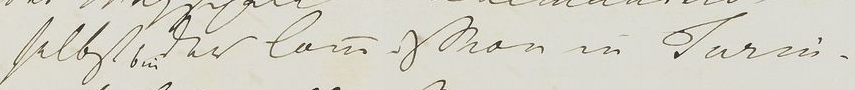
selbst bei der Commission in Turin.
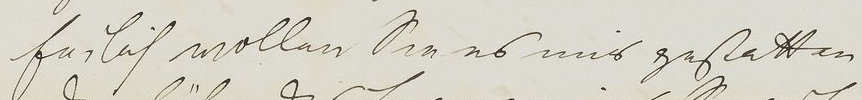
Endlich wollen Sie es mir gestatten
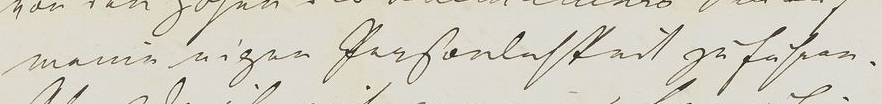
meine eigne Persönlichkeit zu führen.
